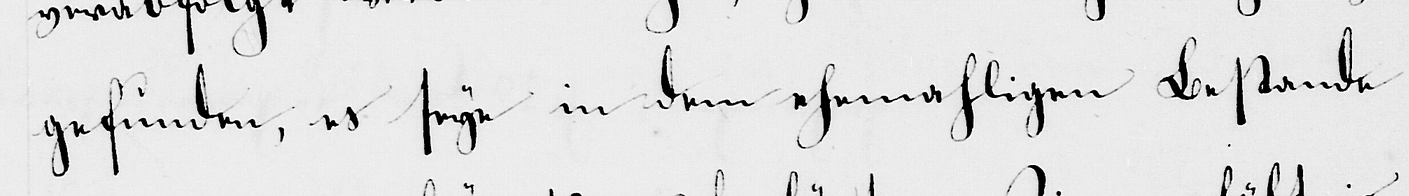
gefunden, es seye in dem ehemahligen Bestande
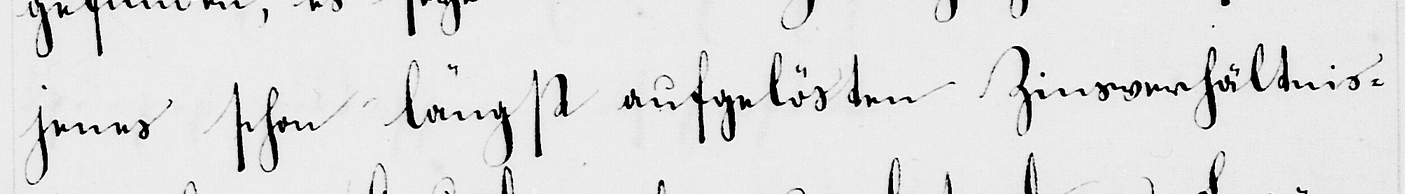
jenes schon längst aufgelösten Zinsverhältnis¬
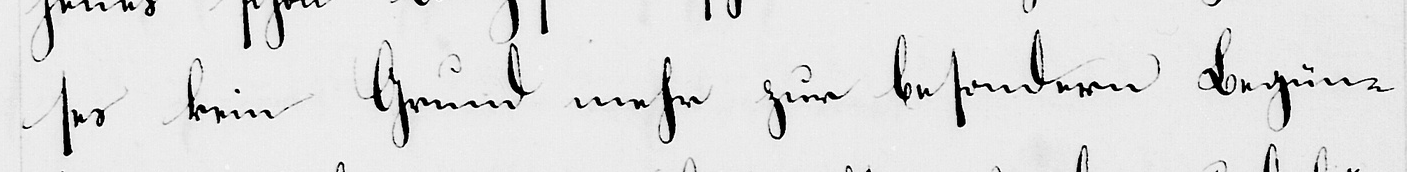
ses kein Grund mehr zur besondern Begün¬
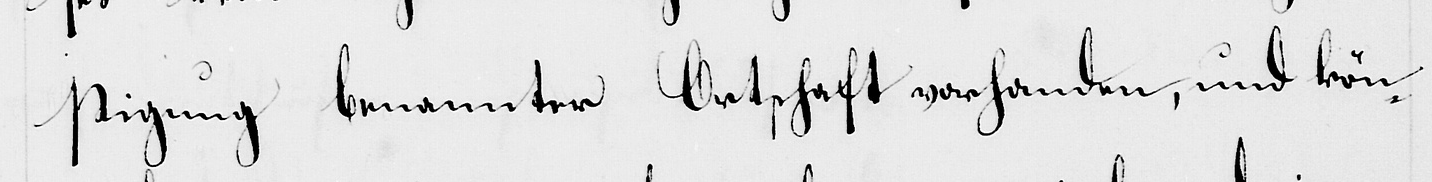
stigung benannter Ortschaft vorhanden, und kön¬
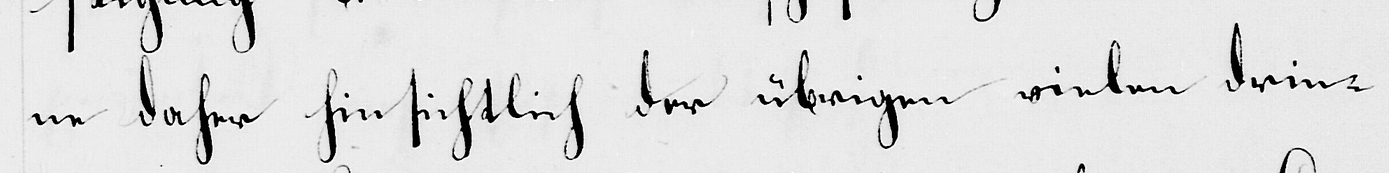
ne daher hinsichtlich der übrigen vielen drin¬
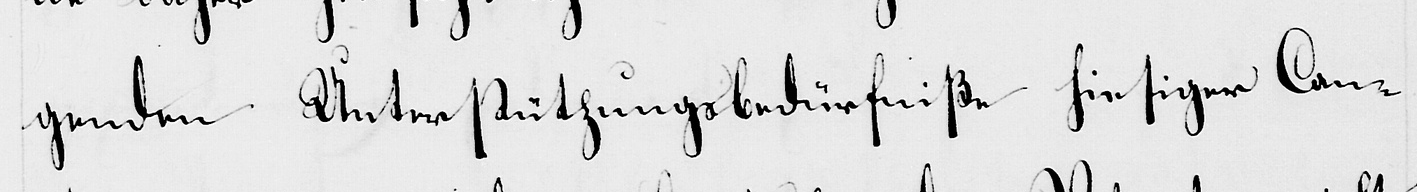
genden Unterstützungsbedürfniße hiesiger Can¬
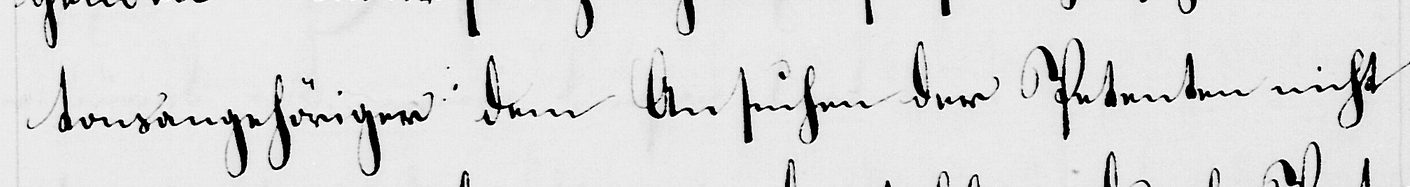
tonsangehöriger dem Ansuchen der Petenten nicht
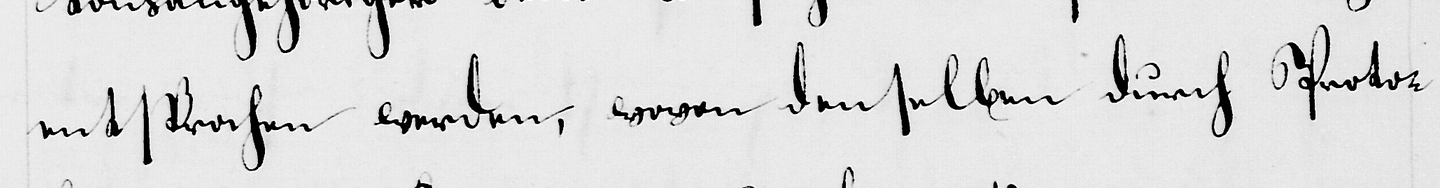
entsprochen werden, wovon denselben durch Proto¬
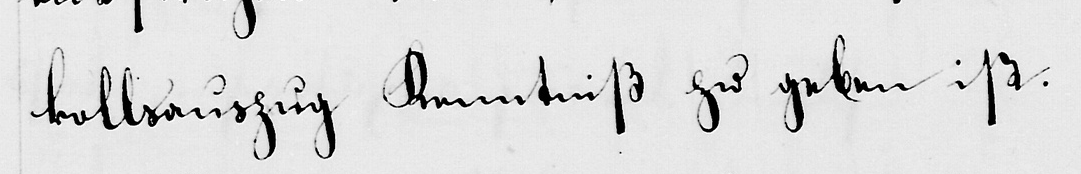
kollsauszug Kenntniß zu geben ist.
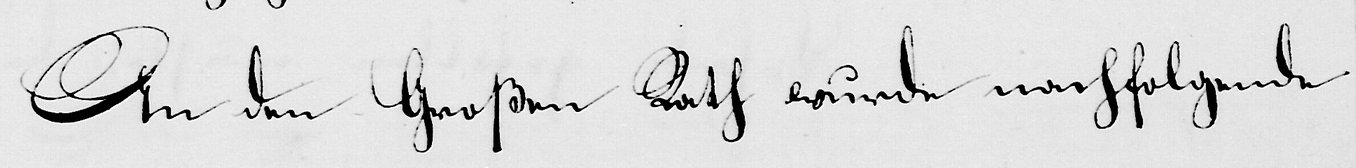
An den Großen Rath wurde nachfolgende
